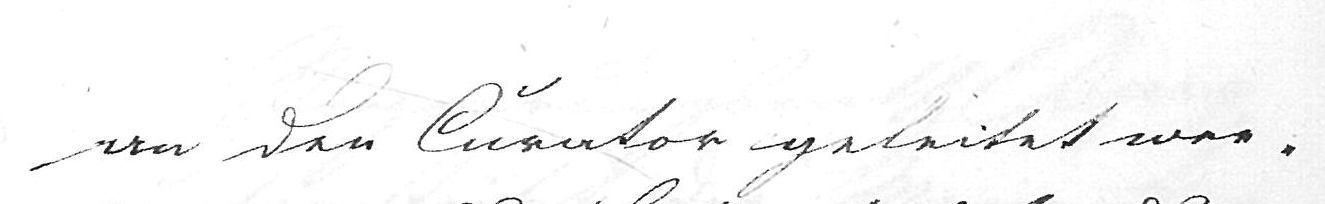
an der Curator geleitet wer-
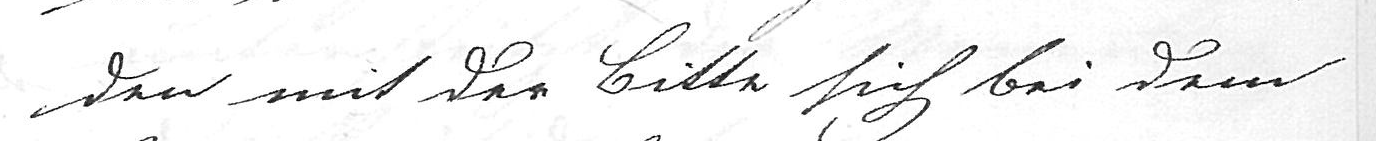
den mit der Bitte sich bei dem
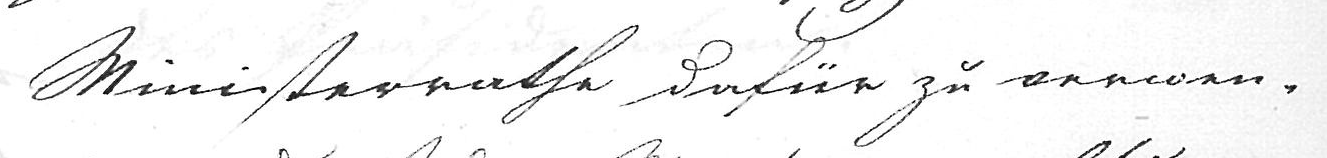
Ministerrathe dafür zu verwen-
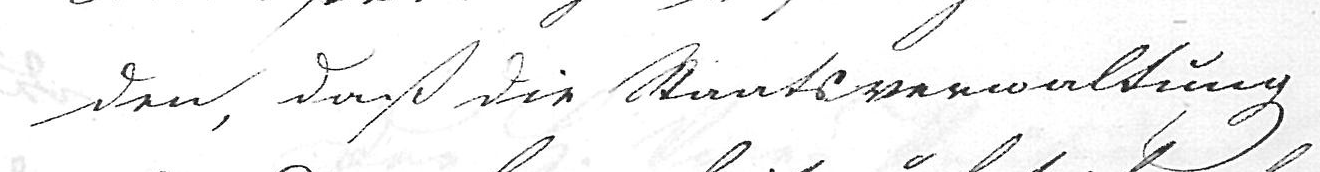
den, daß die Staatsverwaltung
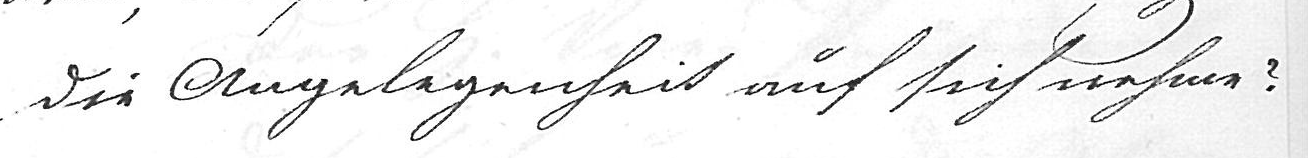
die Angelegenheit auf sich nehme?
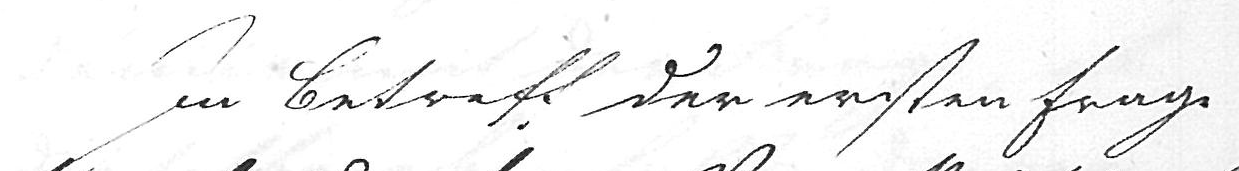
In Betreff der ersten Frage
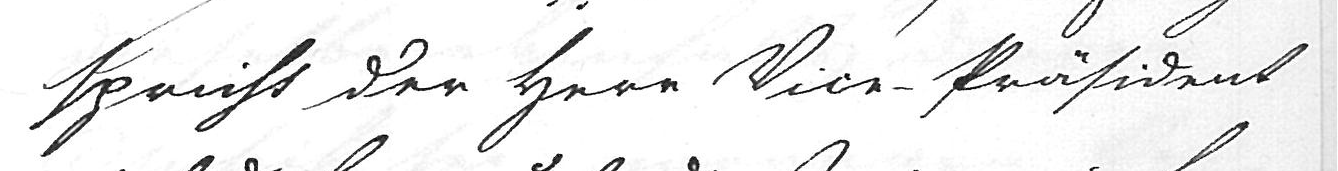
spricht der Herr Vice-Präsident
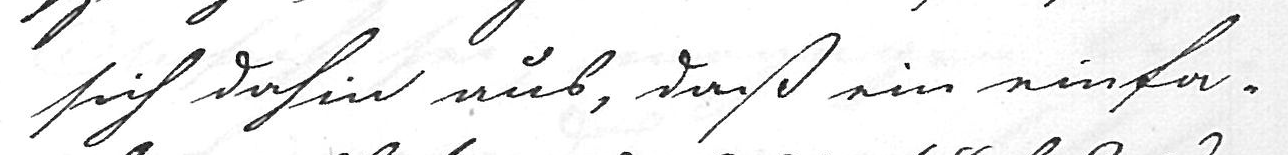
sich dahin aus, daß ein einfa-
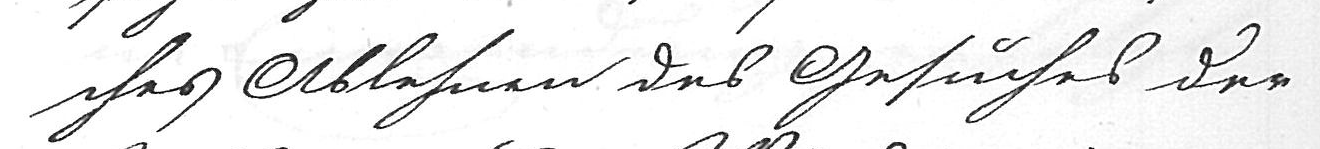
ches Ablesen des Gesuches der
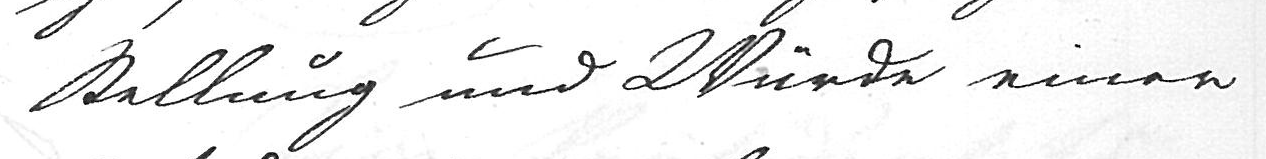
Stellung und Würde einer
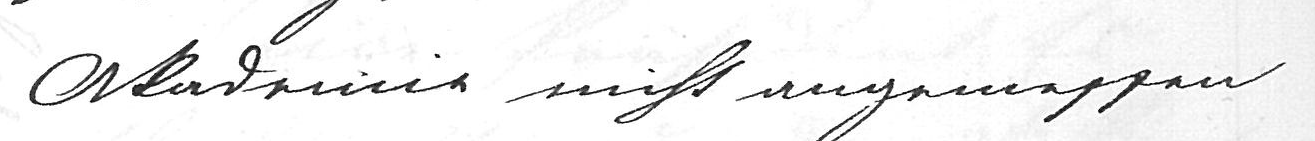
Akademie nicht angemessen
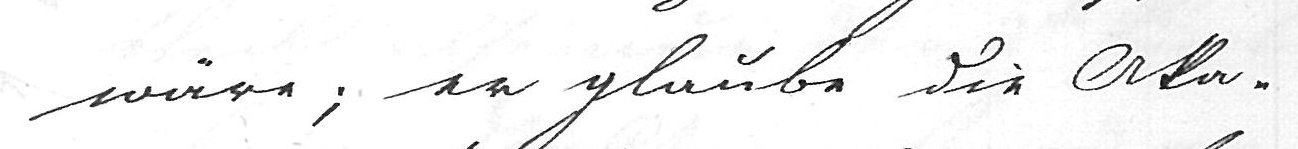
wäre; er glaube die Aka-
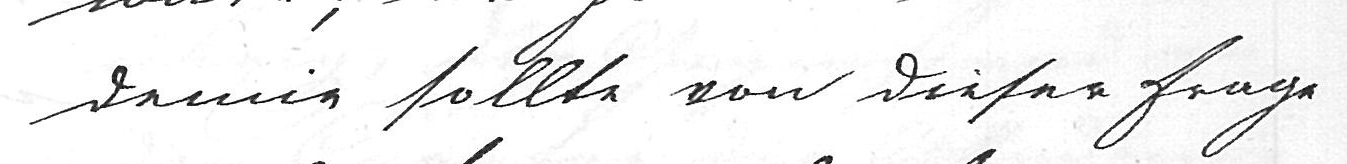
demie sollte von dieser Frage
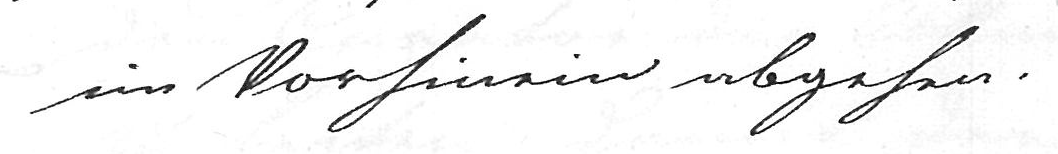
im Vorhinein abgehen.
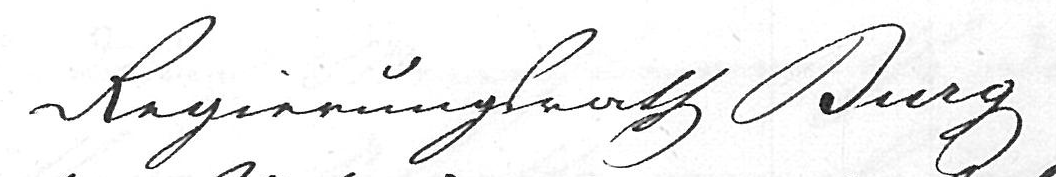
Regierungsrath Burg
